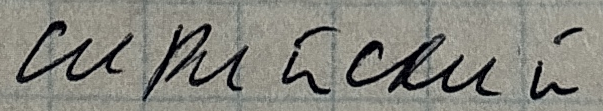сирийский
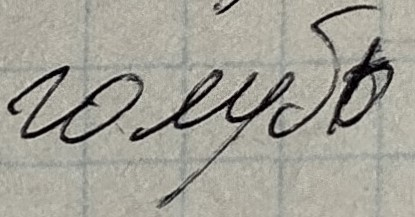голубь
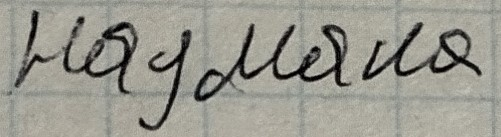наумана
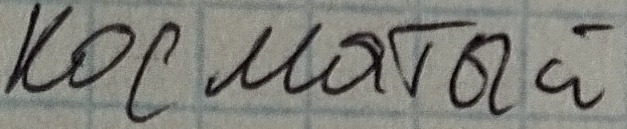косматый
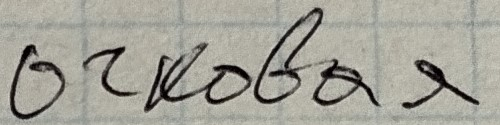очковая
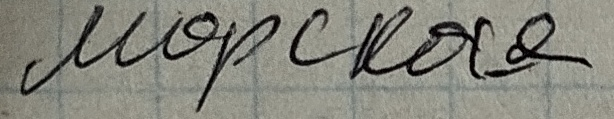морская
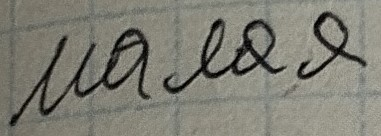малая
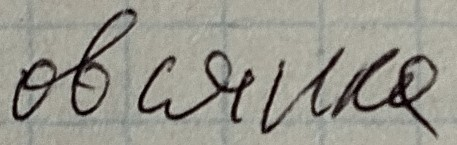овсянка
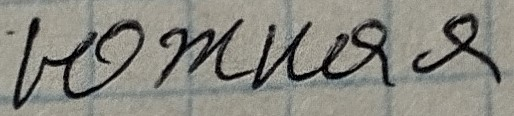южная
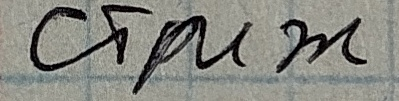стриж
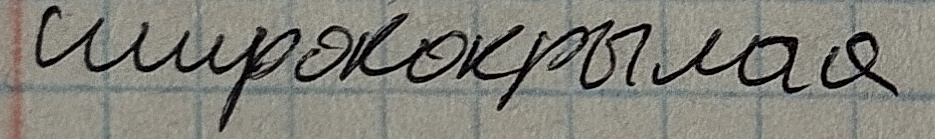ширококрылая
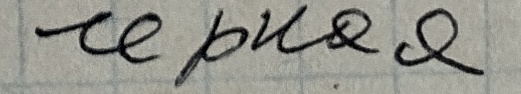черная
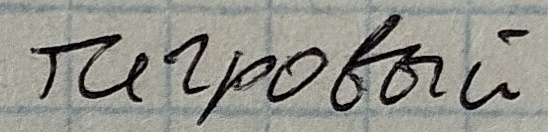тигровый
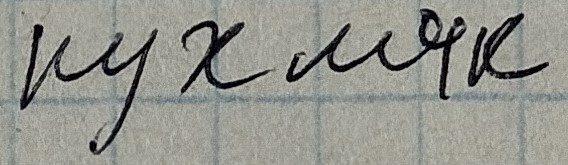пухляк
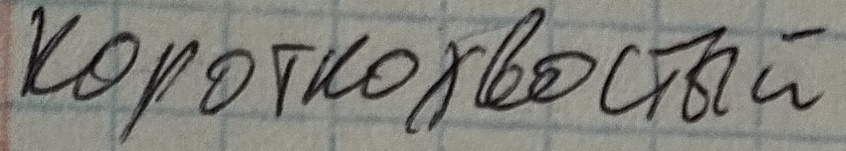короткохвостый
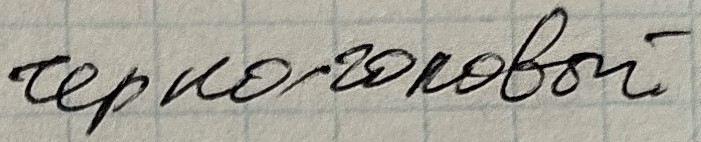черноголовый
